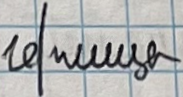горлица
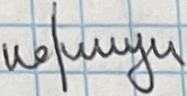коршун
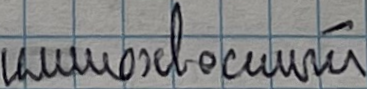клинохвостый
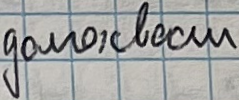долгохвост
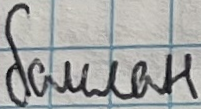баклан
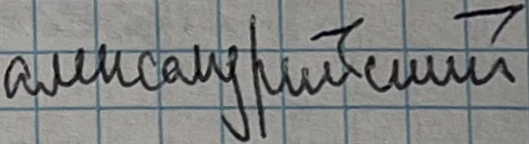александрийский
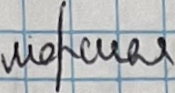морская
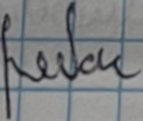рябок
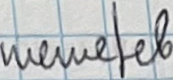тетерев
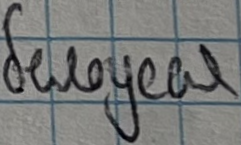белоусая
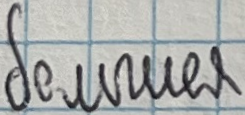большая
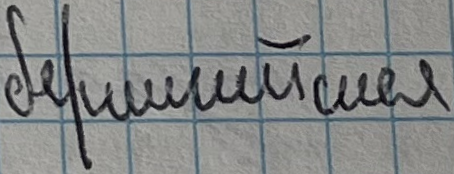берингийская
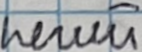пегий
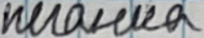пеганка
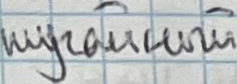тугайный
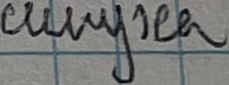сипуха
